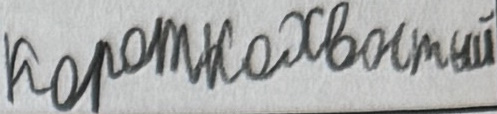короткохвостый
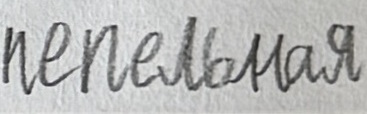пепельная
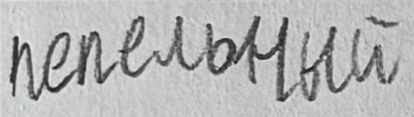пепельный
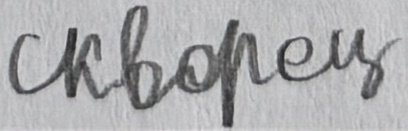скворец
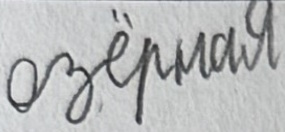озёрная
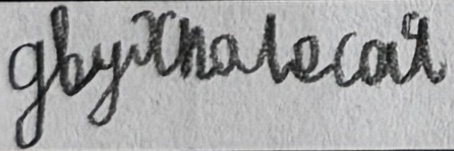двухполосая
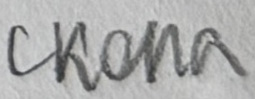скопа
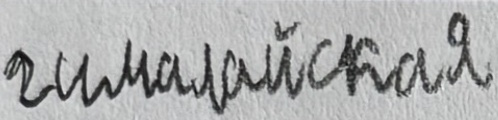гималайская
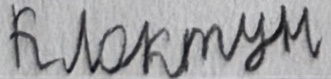клоктун
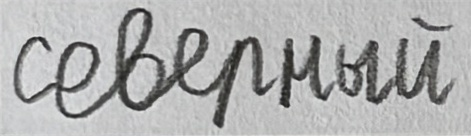северный
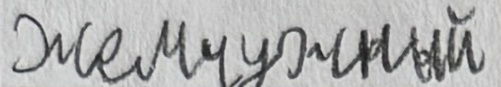жемчужный
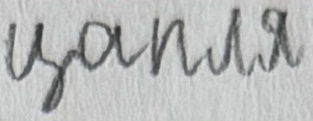цапля
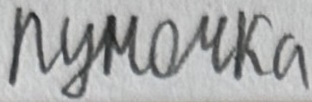пуночка
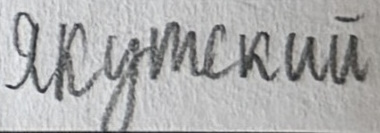якутский
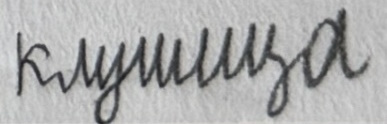клушица
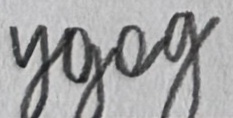удод
